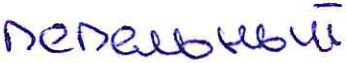пепельный
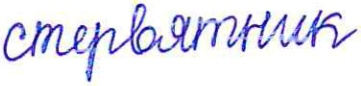стервятник
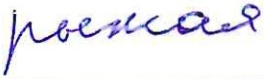рыжая
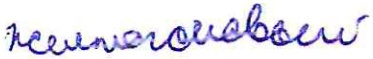желтоголовый
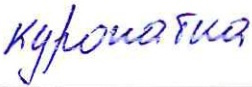куропатка
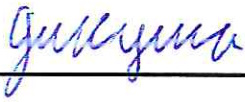дикуша
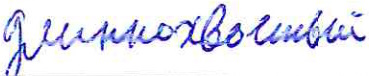длиннохвостый
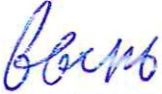выпь
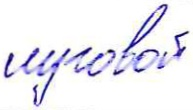луговой
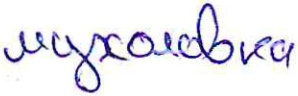мухоловка
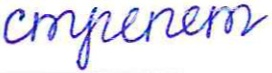стрепет
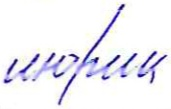люрик
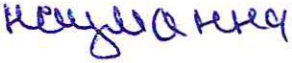науманна
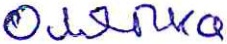оляпка
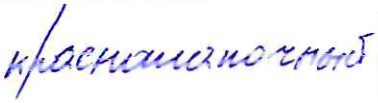красношапочный
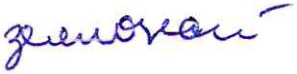земланой
